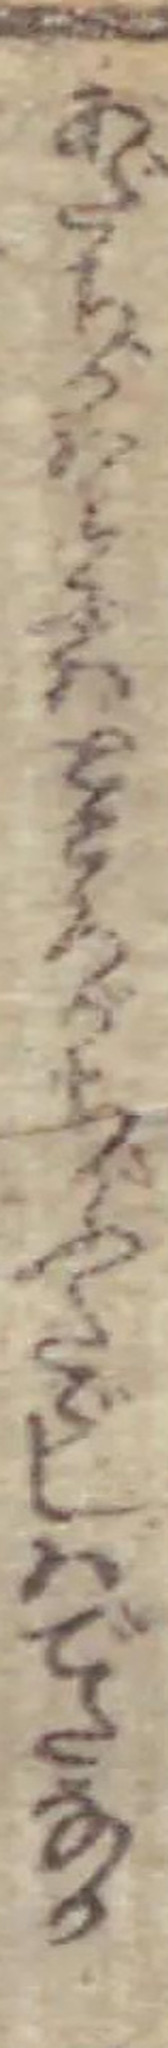あだちがはらにはところがちがふたゞしはでたなり
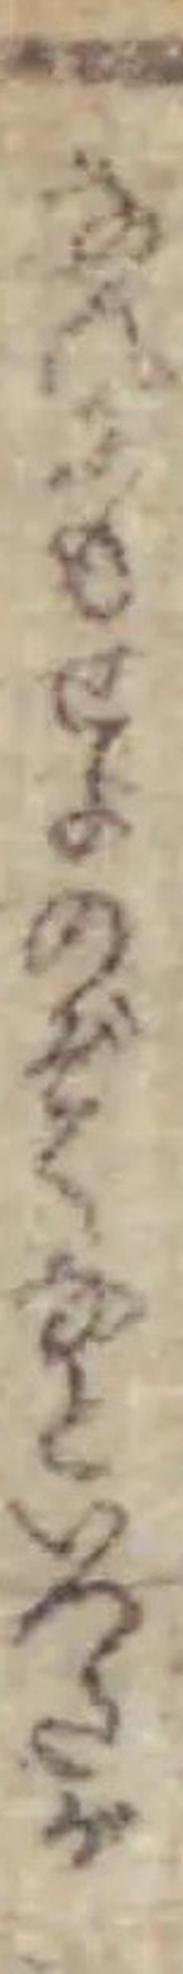なんにもせよのぞくなといつたが
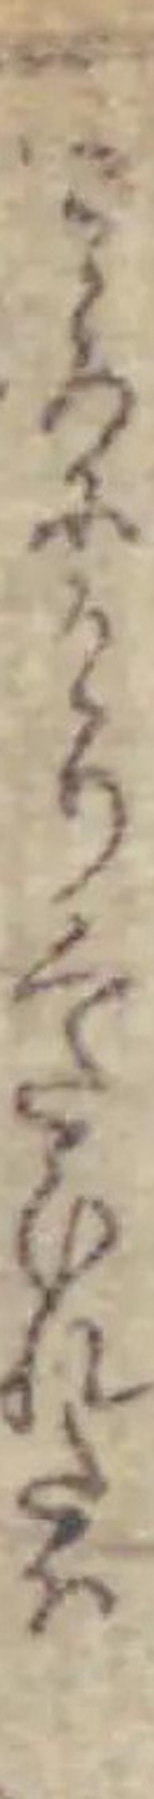こゝろにかゝりくたひれたは
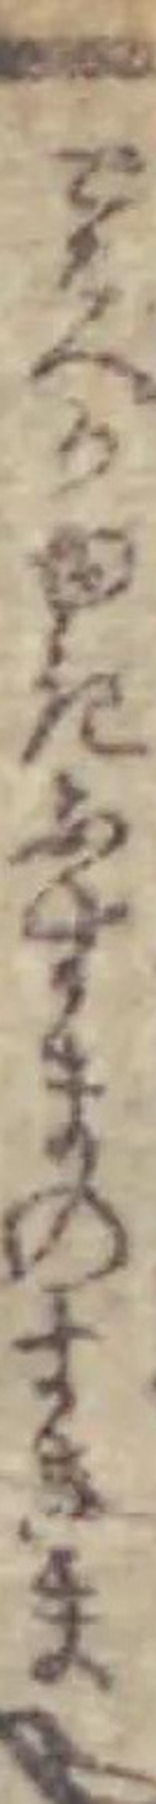ではへりゆきふすまのすきま
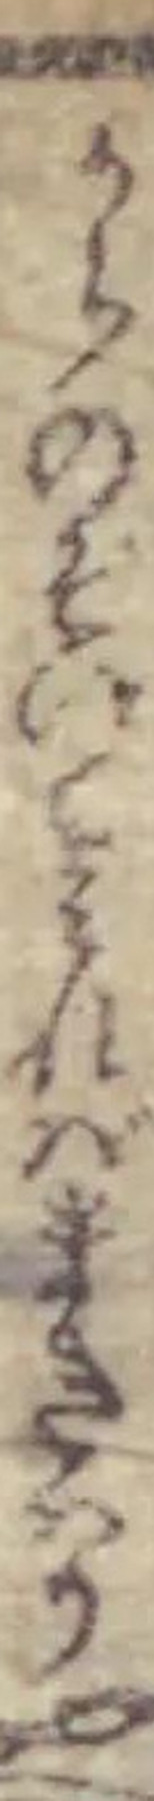からのぞいてみればまきはり
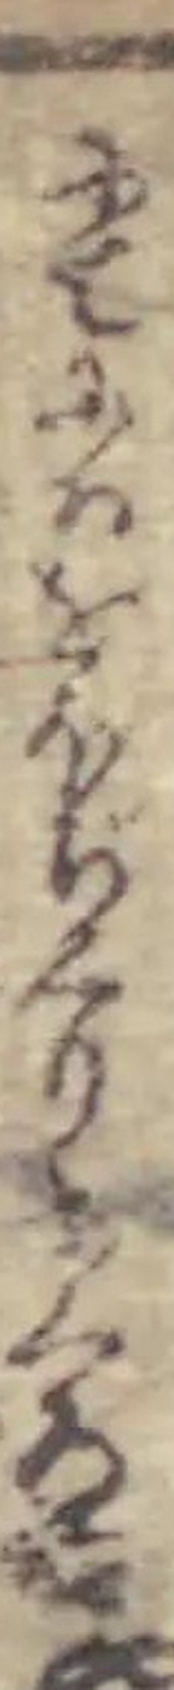にてにはをほぢくりふくろ
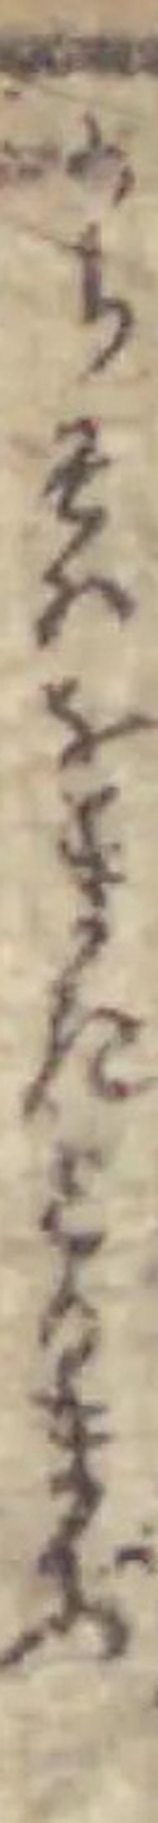からそはをまきみるまに
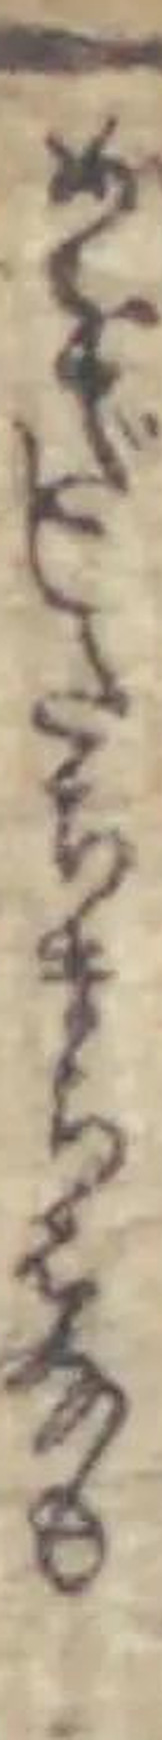めをだしたちまちはなも
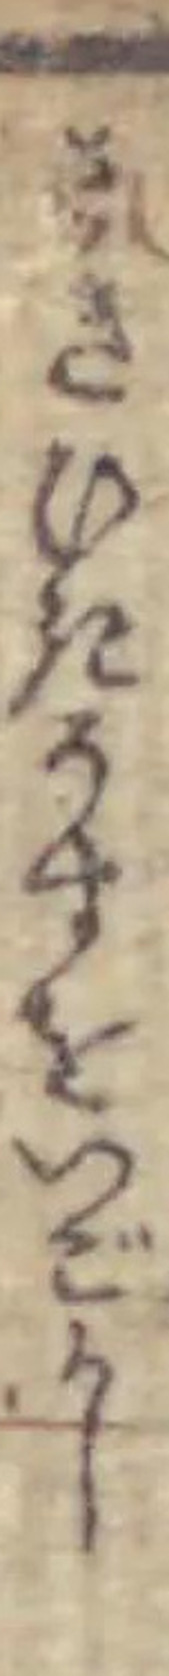さきひきうすをいごかし
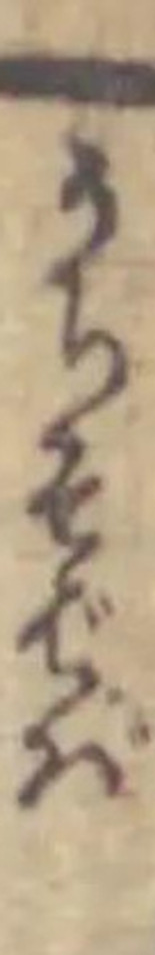うちそばは
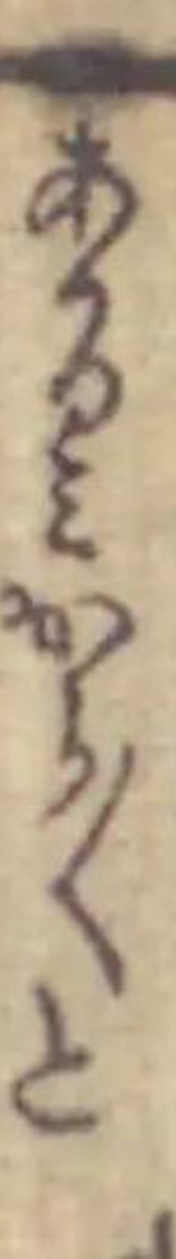あかるみから〳〵と
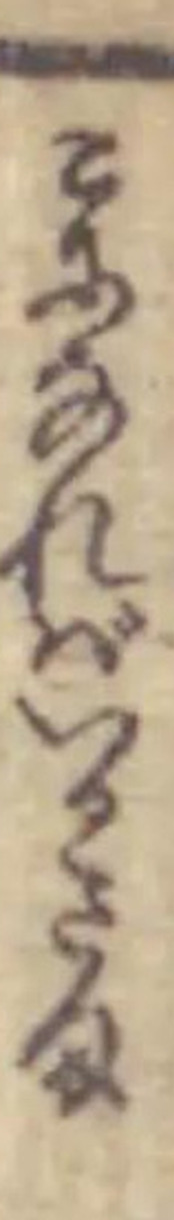こになればいかさま
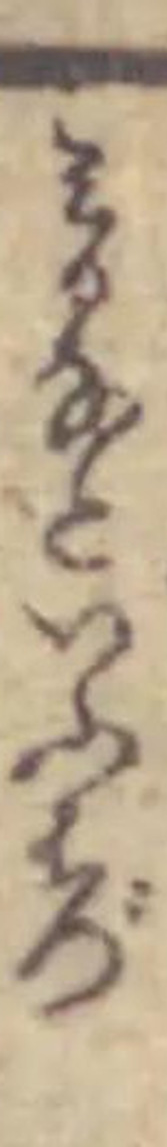みるなといふはづ
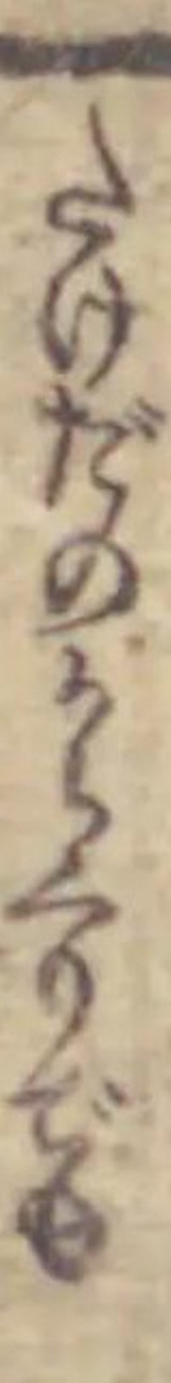たけだのからくりでも
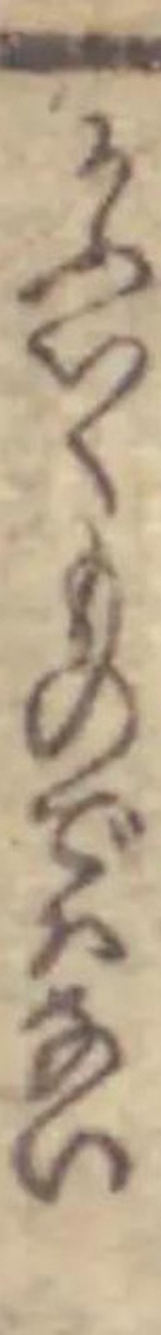かふいくものではない
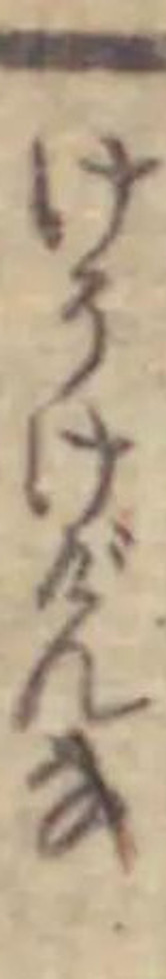けうけげんな
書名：もふもふもふ怖噺 2巻
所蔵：国立国会図書館 National Diet Library, JAPAN
